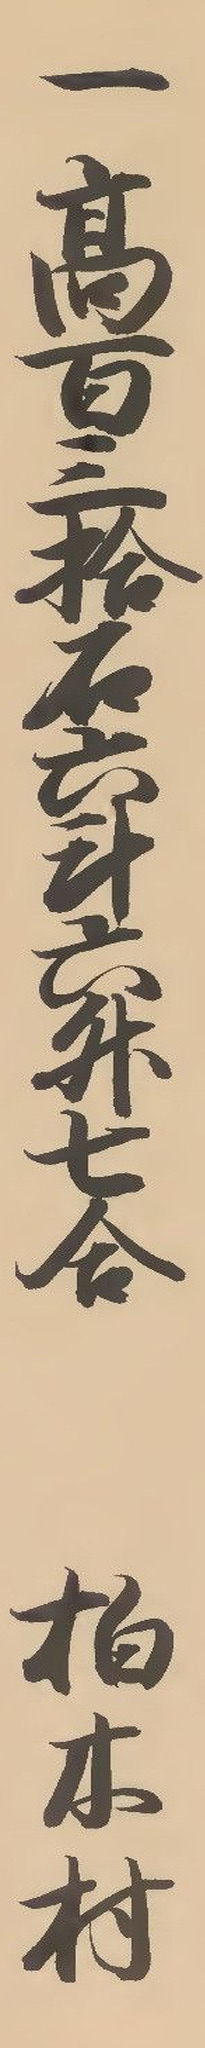一高百三拾石六斗六升七合柏木村
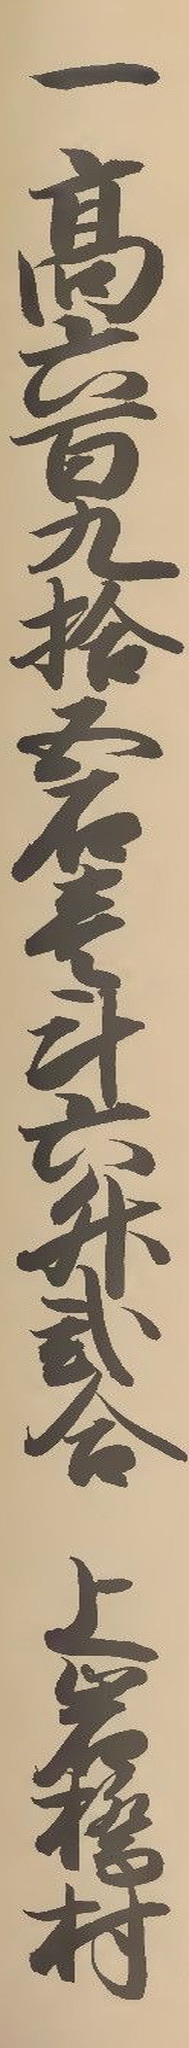一高六百九拾五石壱斗六升弐合上岩橋村
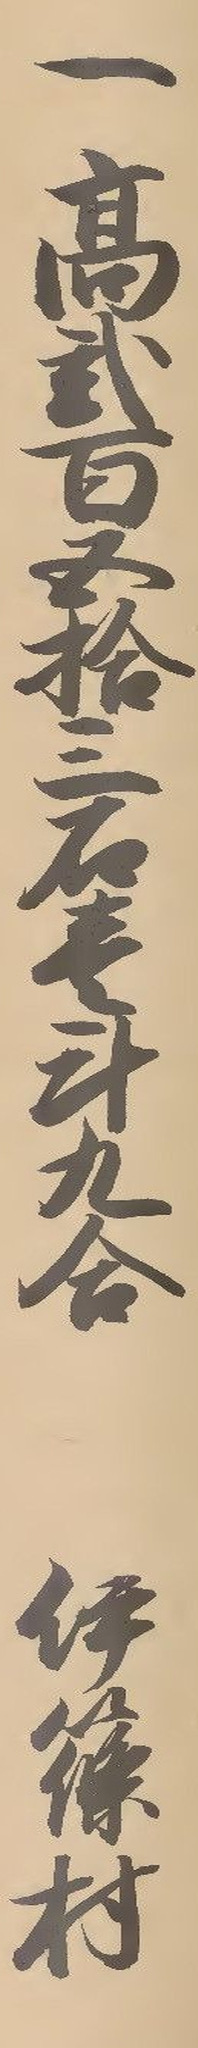一高弐百五拾三石壱斗九合伊篠村
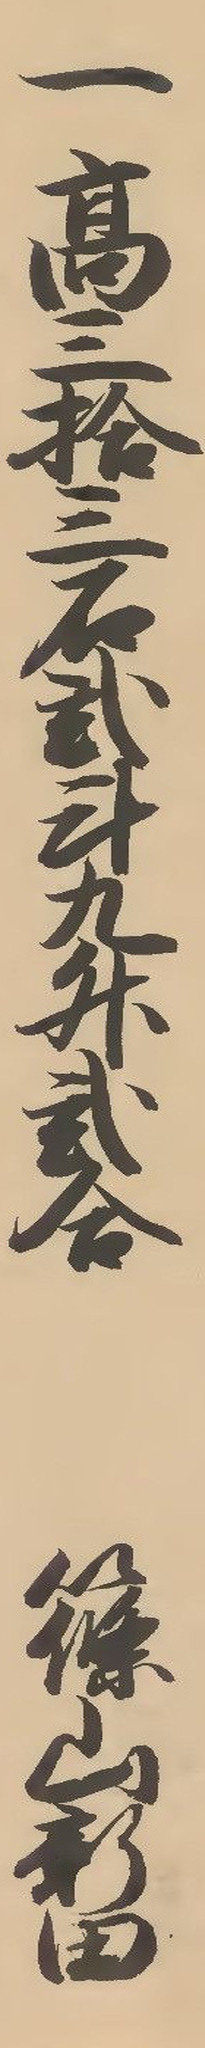一高三拾三石弐斗九升弐合篠山新田
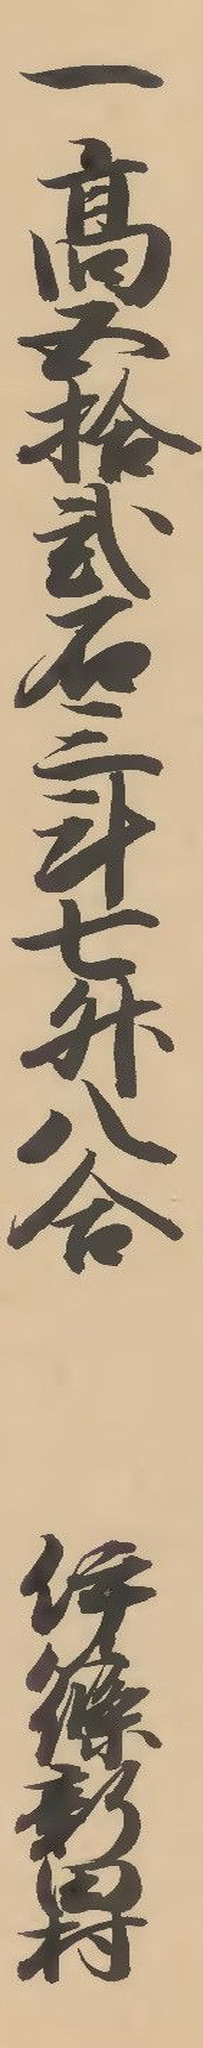一高五拾弐石三斗七升八合伊篠新田村
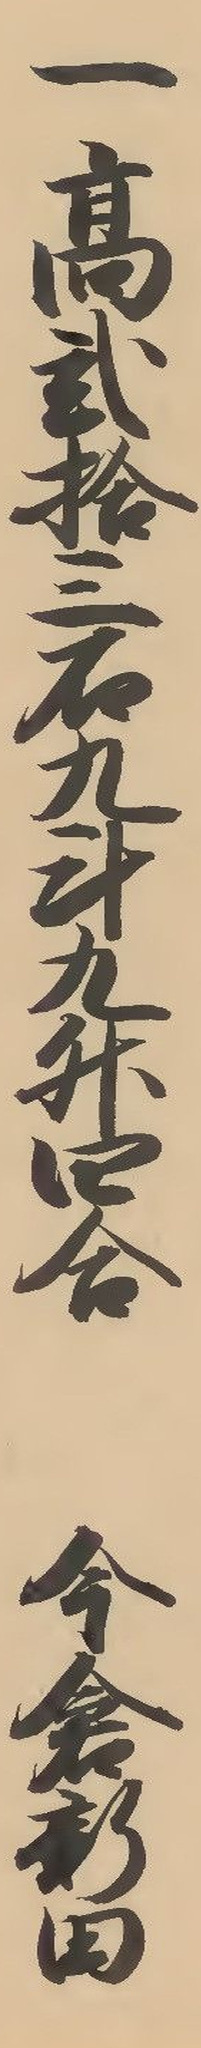一高弐拾三石九斗九升四合今倉新田

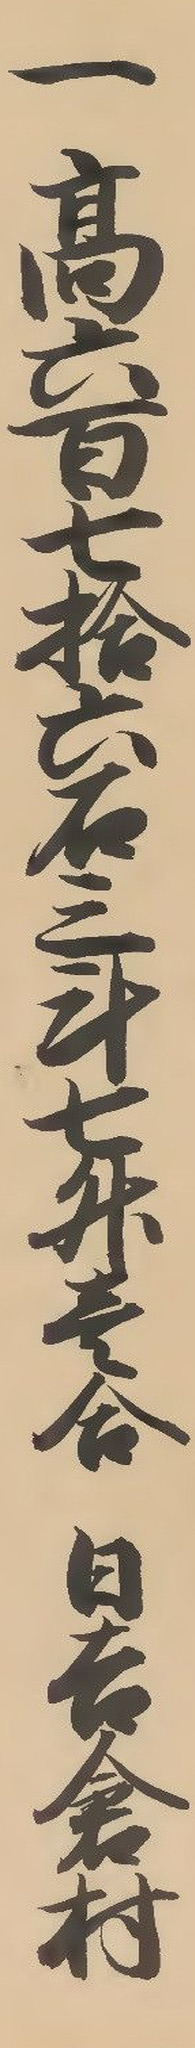一高六百七拾六石三斗七升壱合日吉倉村
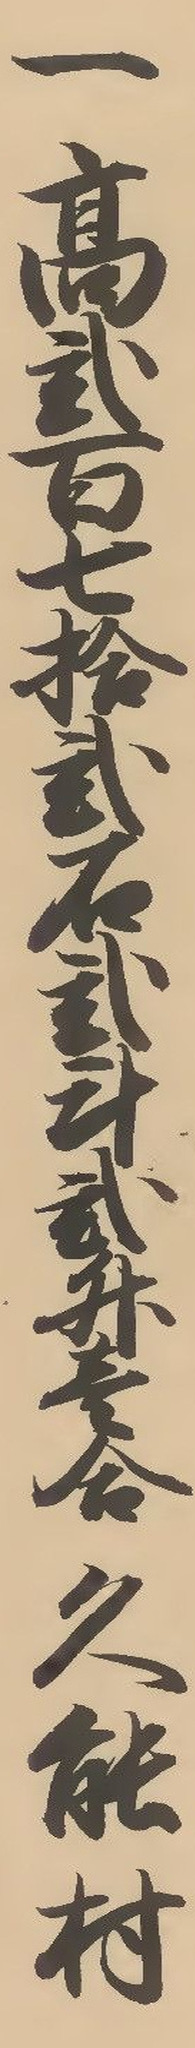一高弐百七拾弐石弐斗弐升壱合久能村
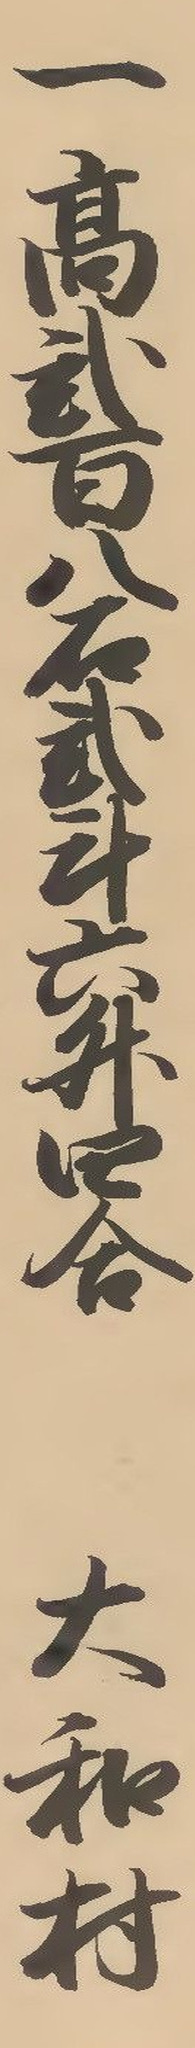一高弐百八石弐斗六升四合大和村
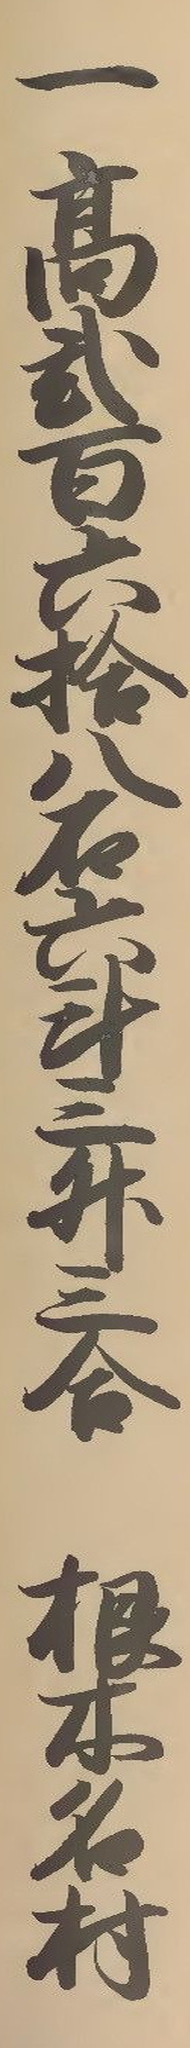一高弐百六拾八石六斗三升三合根木名村
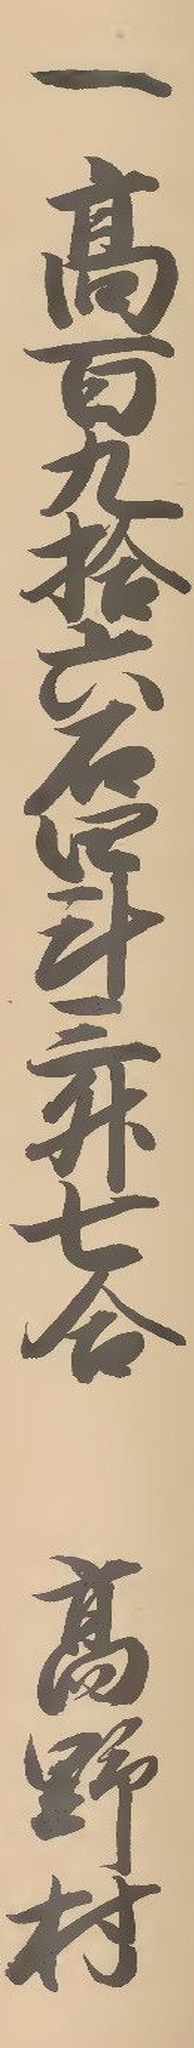一高百九拾六石四斗三升七合高野村
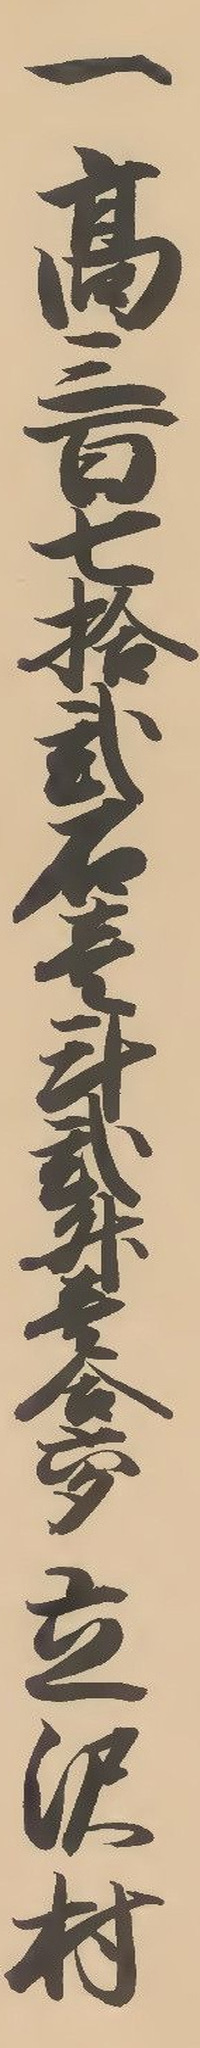一高三百七拾弐石壱斗弐升壱合六勺立沢村
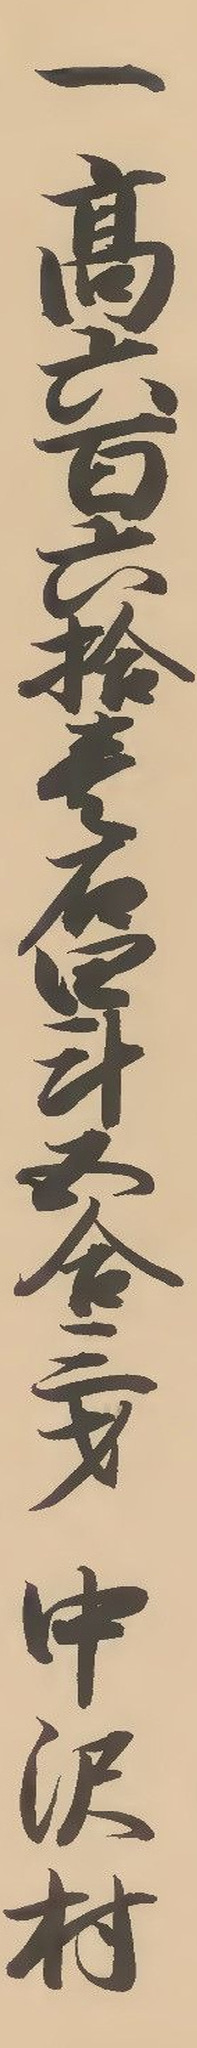一高六百六拾壱石四斗五合三才中沢村
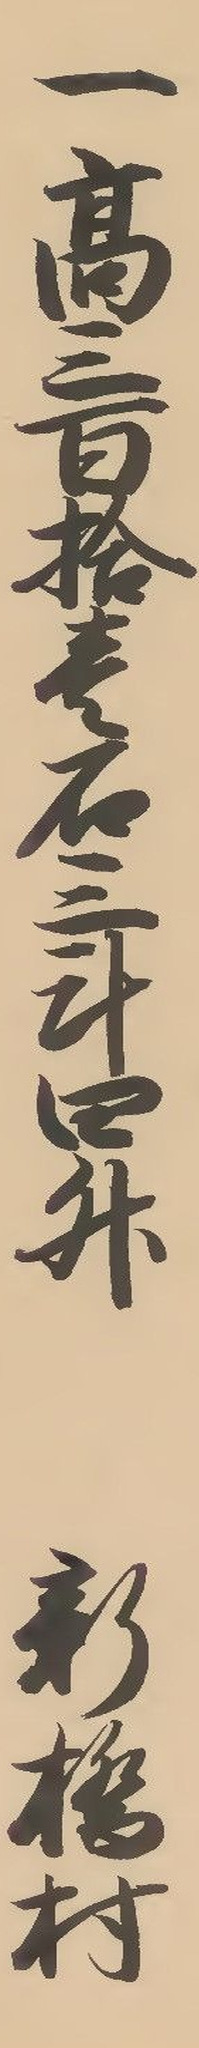一高三百拾壱石三斗四升新橋村

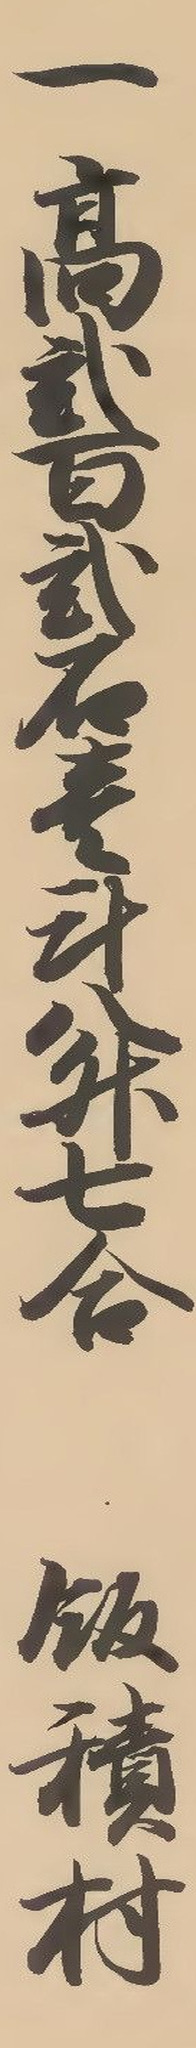一高弐百弐石壱斗八升七合飯積村
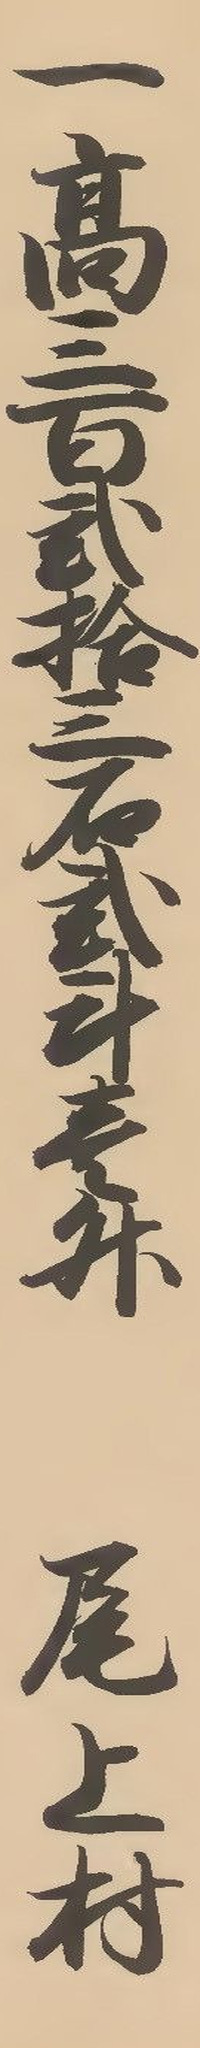一高三百弐拾三石弐斗壱升尾上村
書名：下総国郷帳
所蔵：国立公文書館 National Archives of Japan
